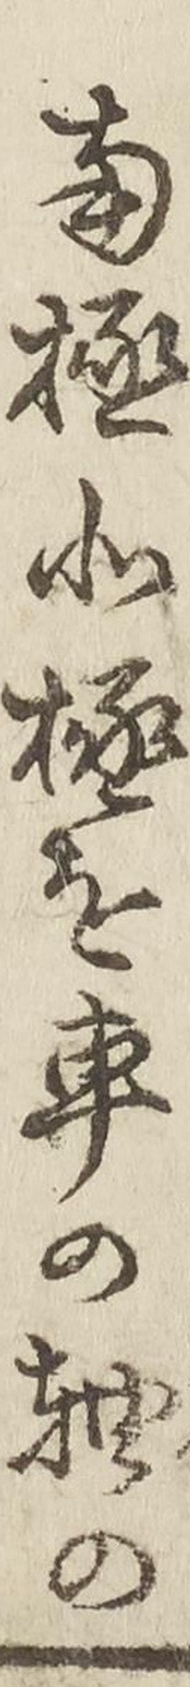南極北極を車の軸の
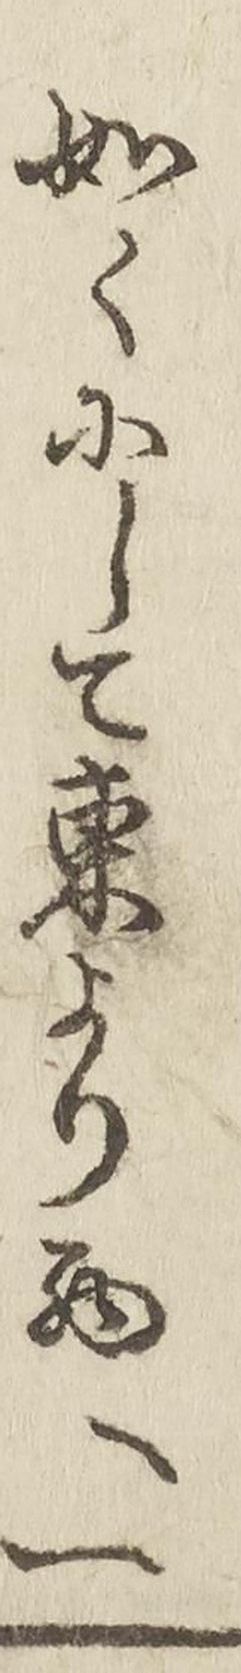如くにして東より西へ一
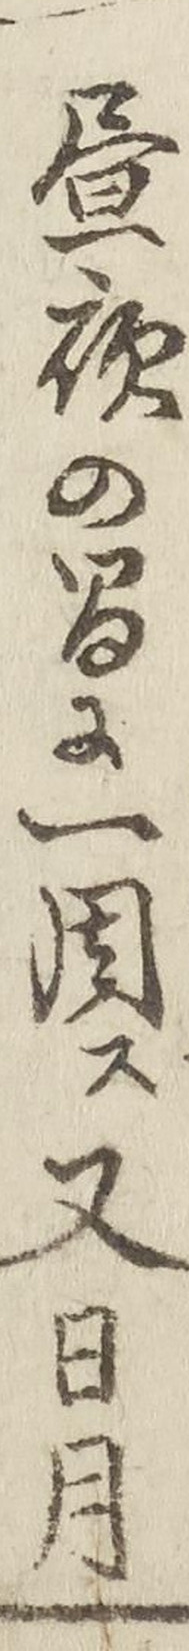昼夜の間に一周ス又日月
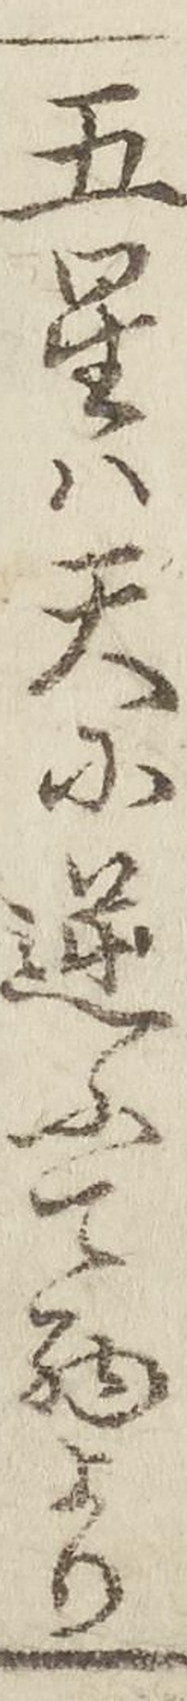五星は天に逆ふて西より
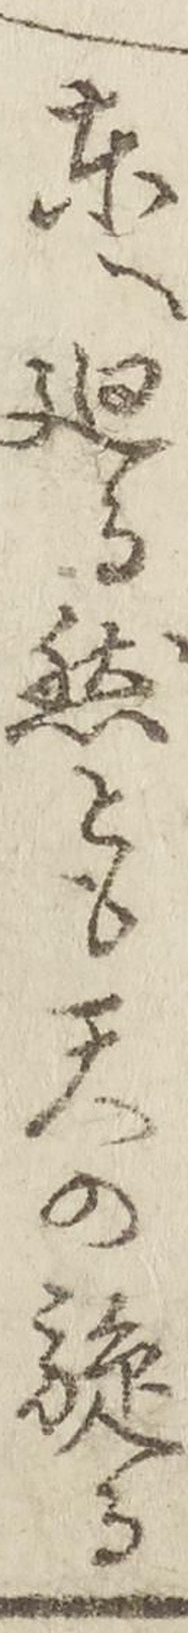東へ廻る然とも天の旋る
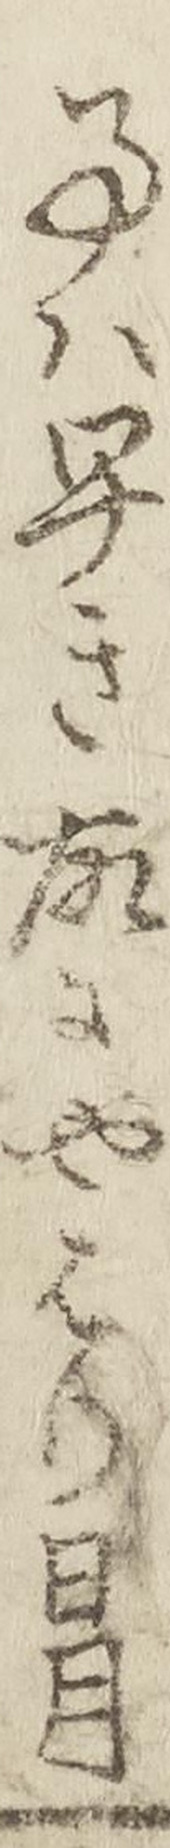事は早き故にやはり日月
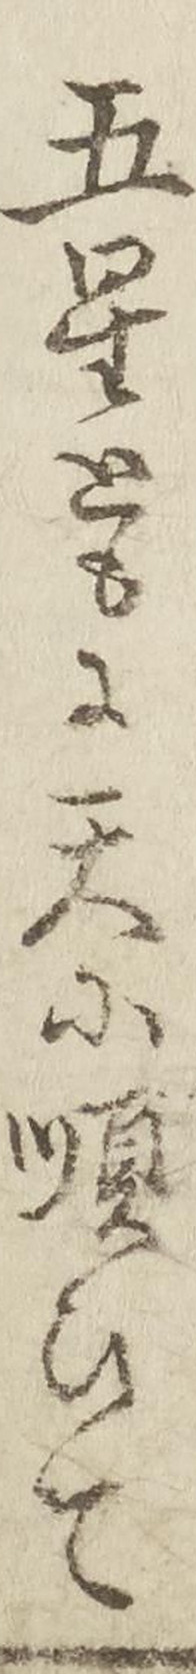五星ともに天に順ひて
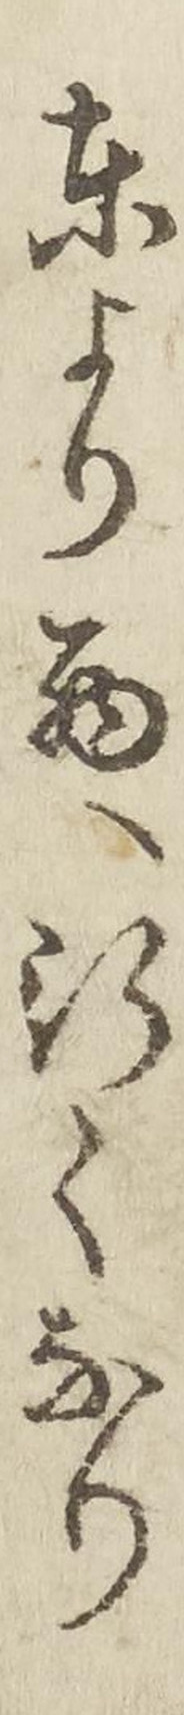東より西へ行くなり

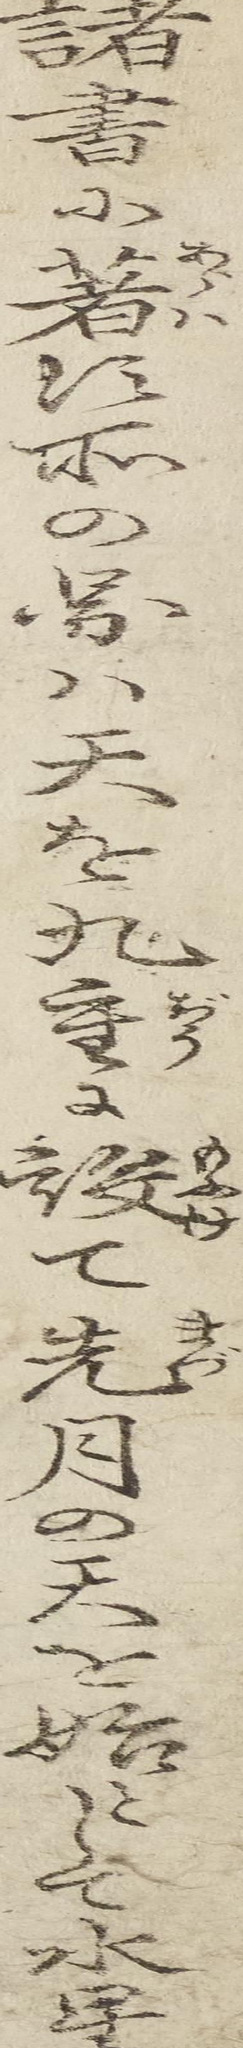諸書に著す所の図は天を九重に設て先月の天を始として水星
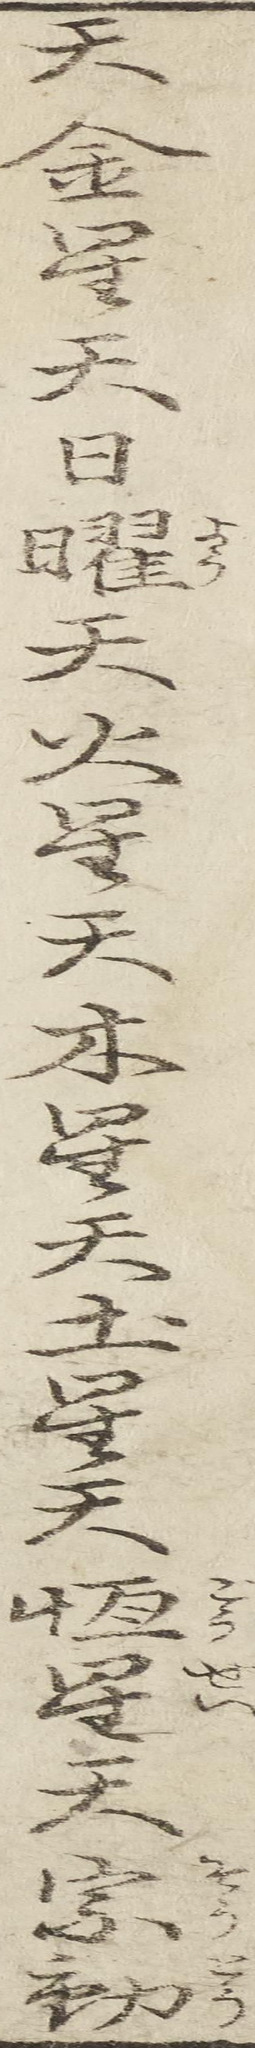天金星天日曜天火星天木星天土星天恒星天宗動
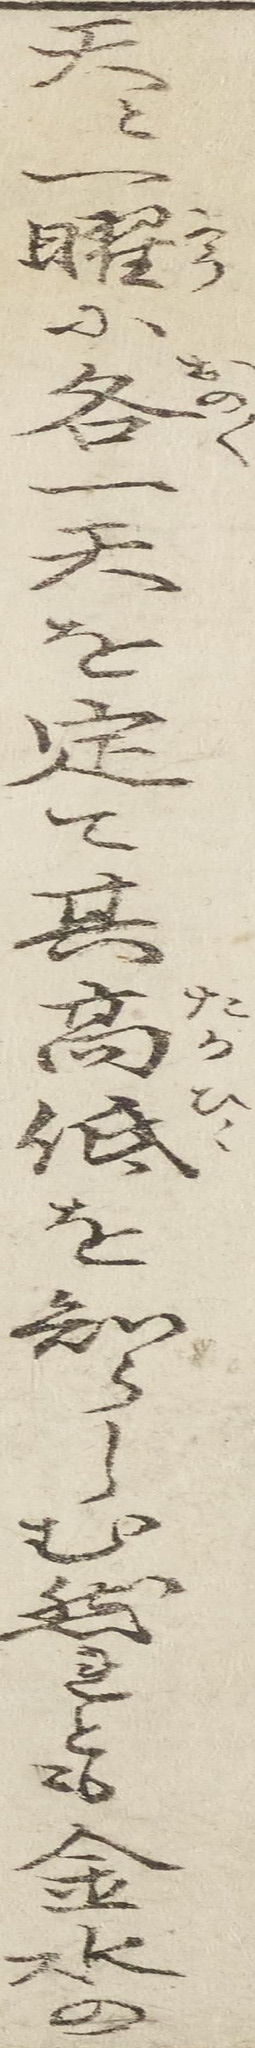天と一曜に各一天を定て其高低を知らしむ然れとも金水の
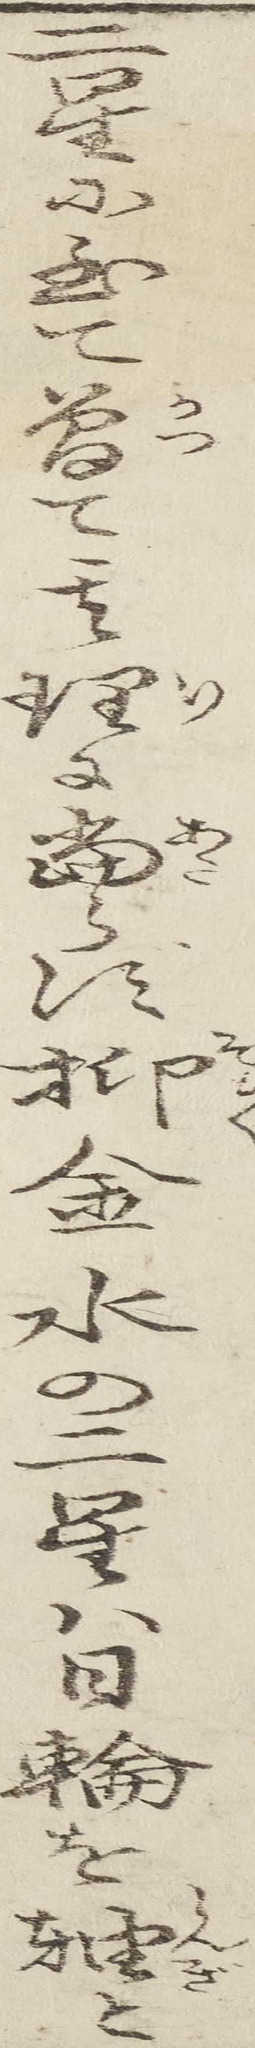二星に至て曽て其理に当らす抑金水の二星は日輪を軸と
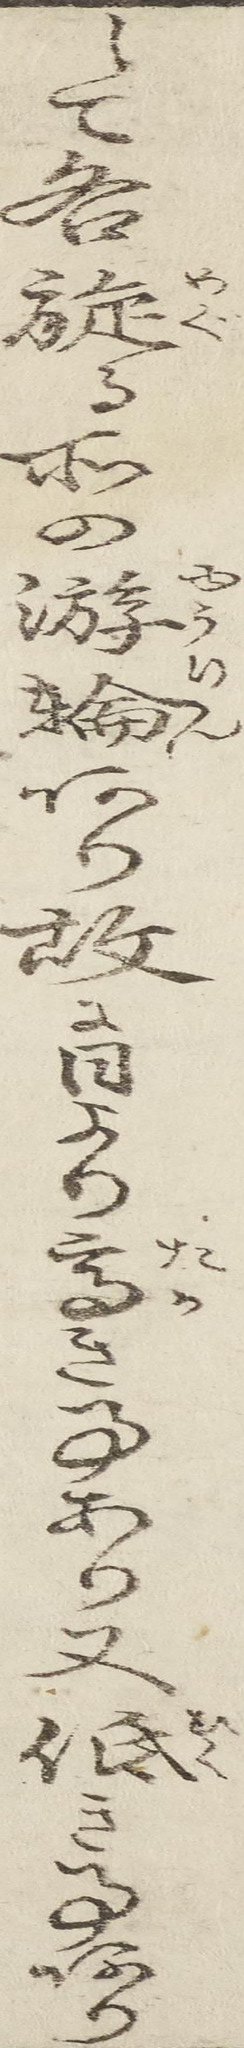して各旋る所の游輪あり故に日より高き事あり又低き事あり
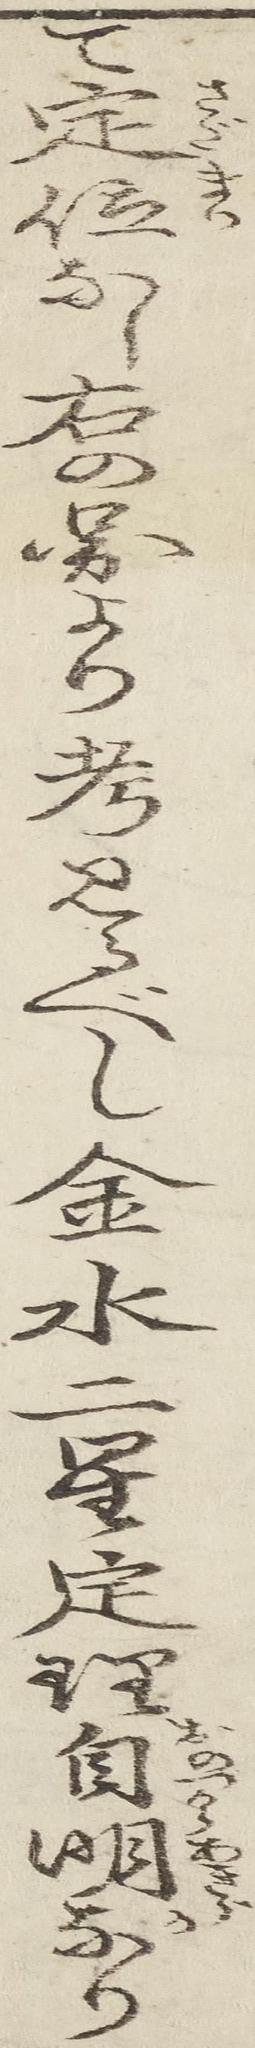て定位なし右之図より考見るべし金水二星定理自明なり
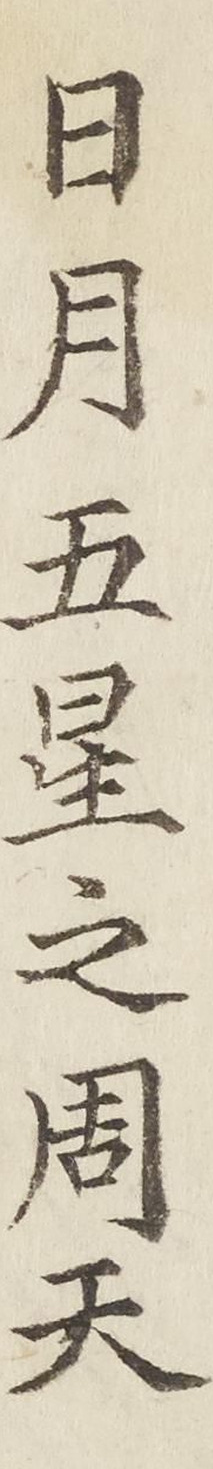日月五星之周天
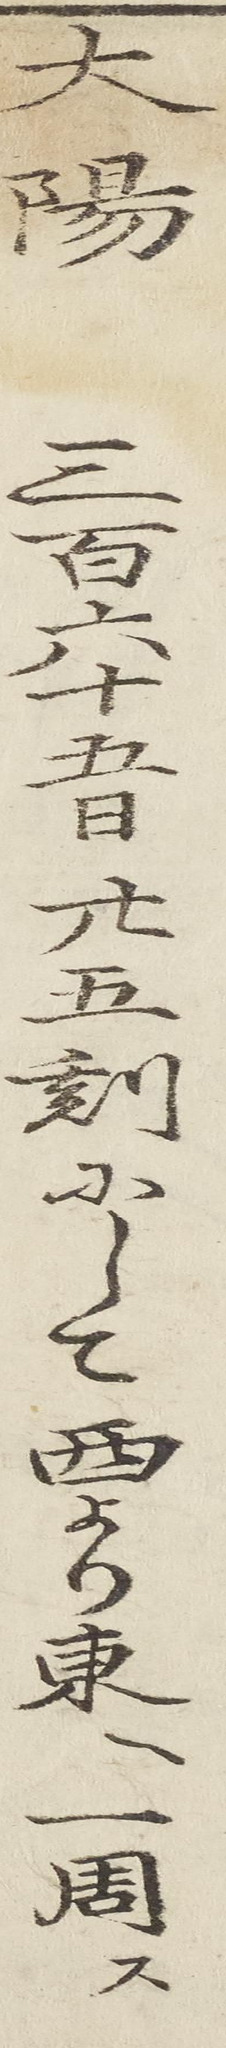大陽三百六十五日廿五刻にして西より東へ一周ス
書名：平天儀圖解
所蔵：東京大学地震研究所図書室 Earthquake Research Institute Library, The University of Tokyo, JAPAN
